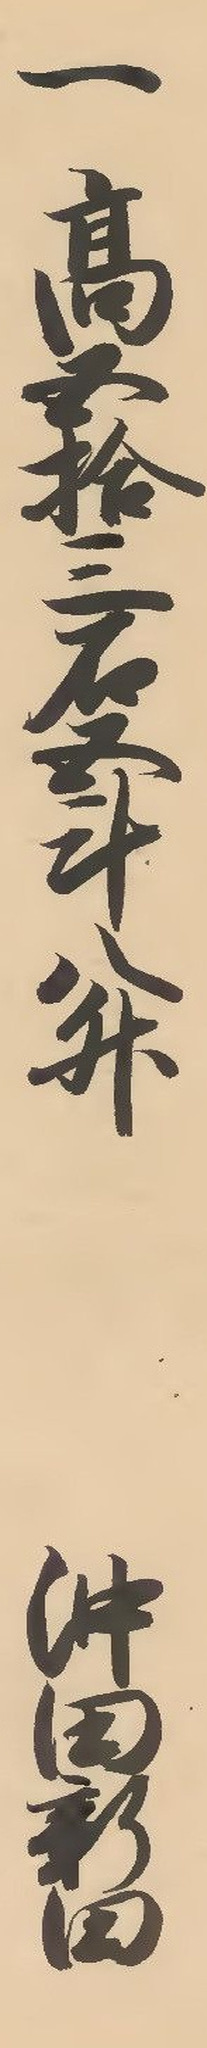一高五拾三石五斗八升沖田新田
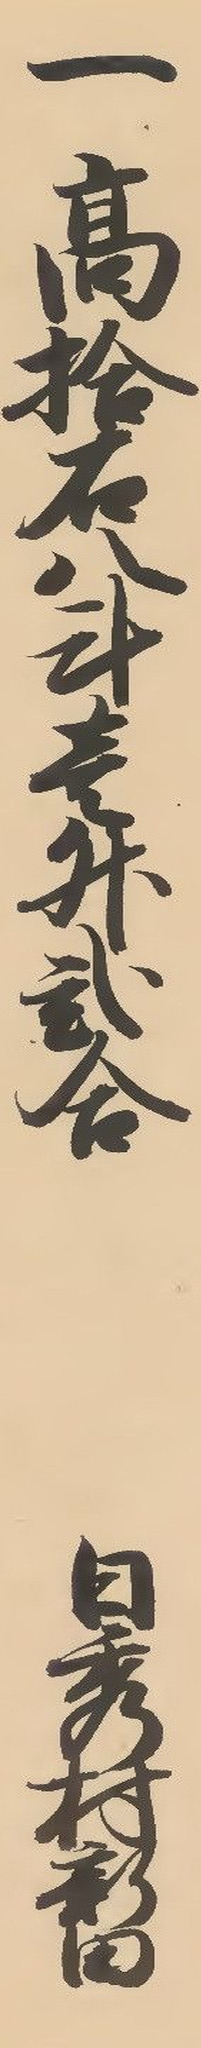一高拾石八斗壱升弐合日秀村新田
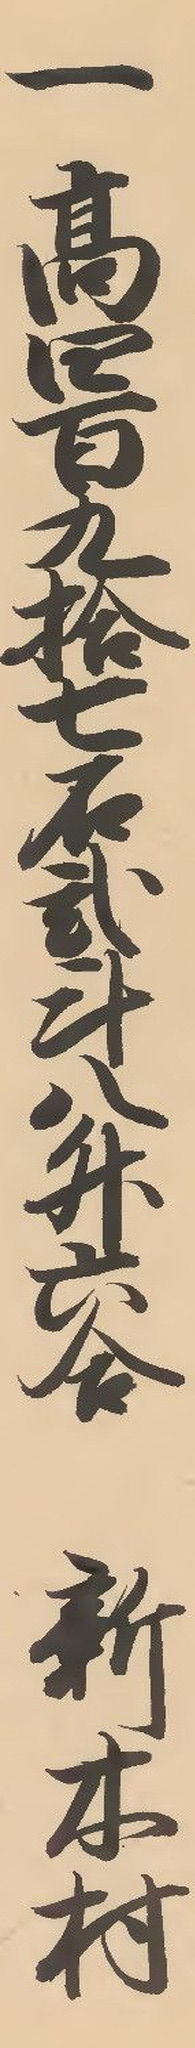一高四百九拾七石弐斗八升六合新木村
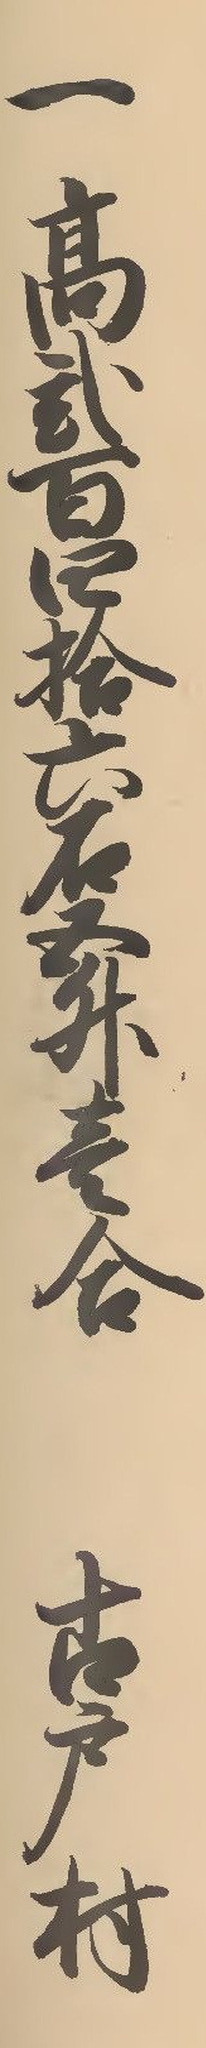一高弐百四拾六石五升壱合古戸村
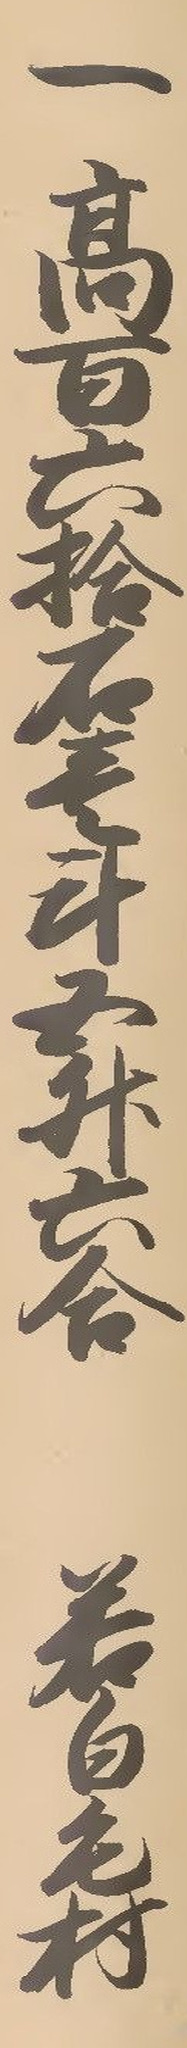一高百六拾石壱斗五升六合若白毛村
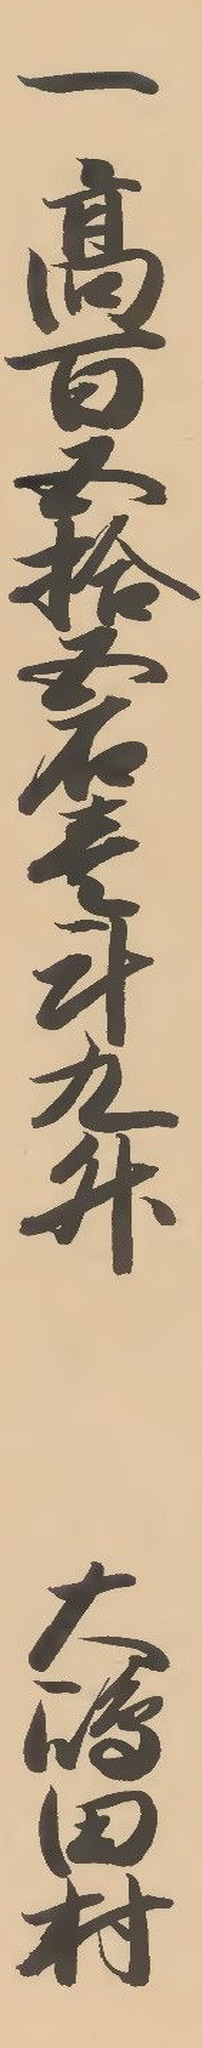一高百五拾五石壱斗九升大島田村
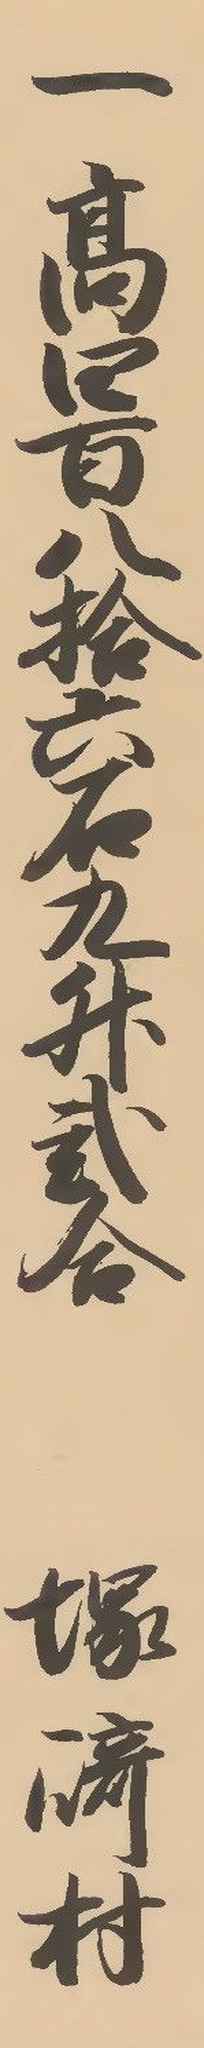一高四百八拾六石九升弐合塚崎村
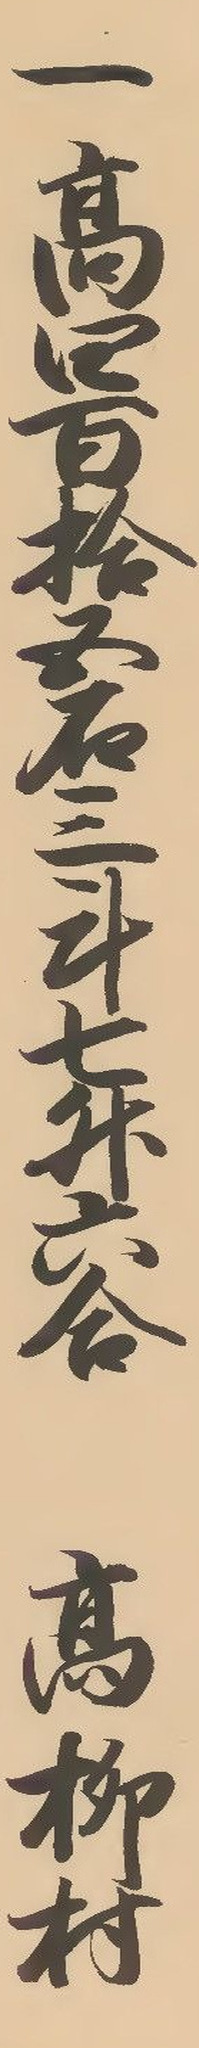一高四百拾五石三斗七升六合高柳村

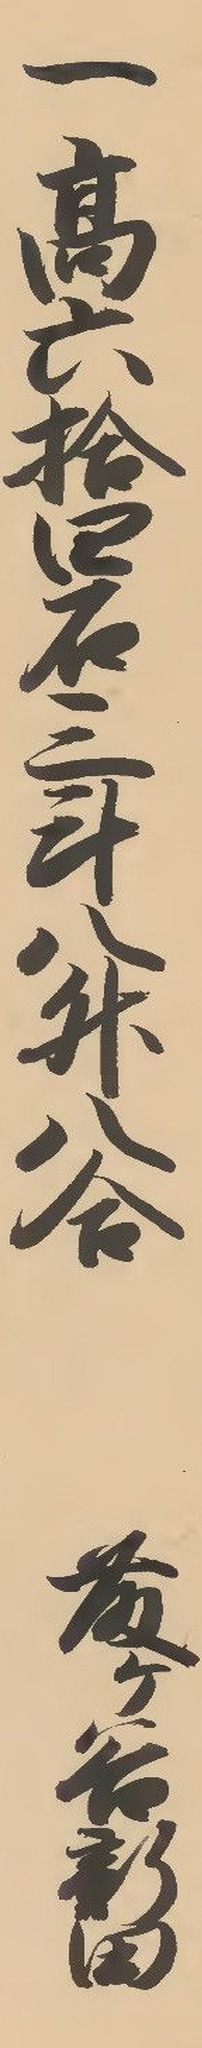一高六拾四石三斗八升八合藤ヶ谷新田
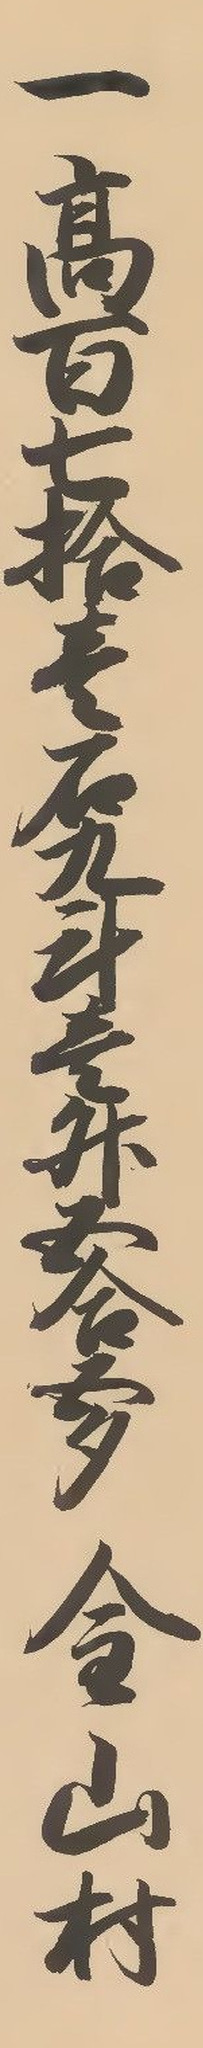一高百七拾壱石九斗壱升五合五勺金山村
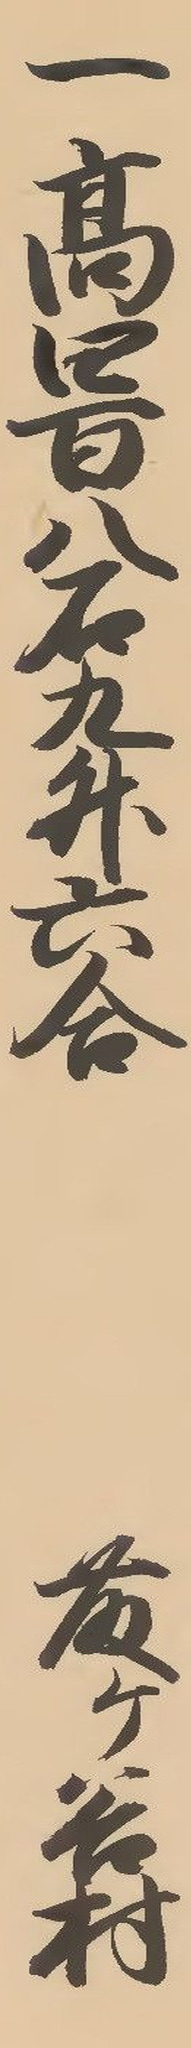一高四百八石九升六合藤ヶ谷村
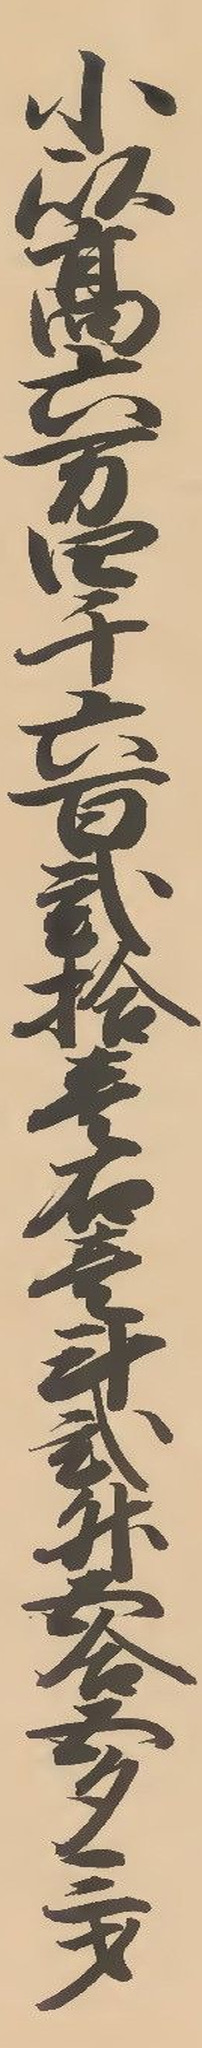小以高六万四千六百弐拾壱石壱斗弐升五合五勺三才
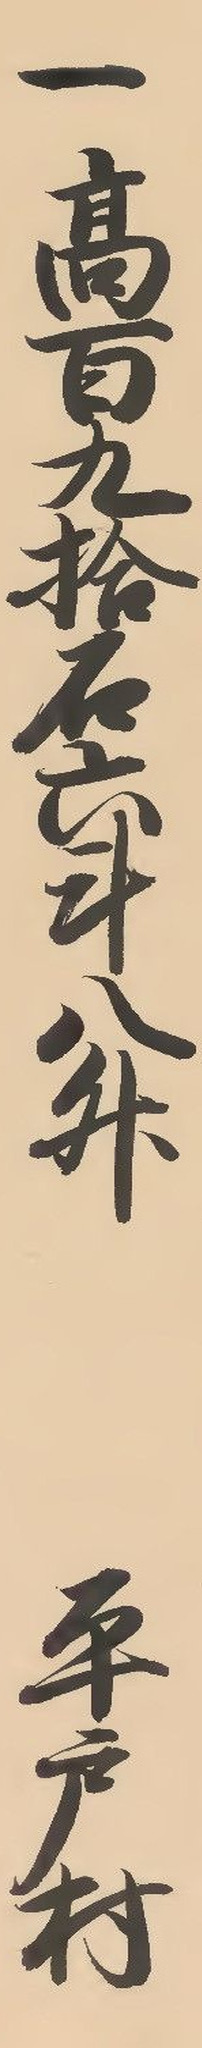一高百九拾石六斗八升平戸村
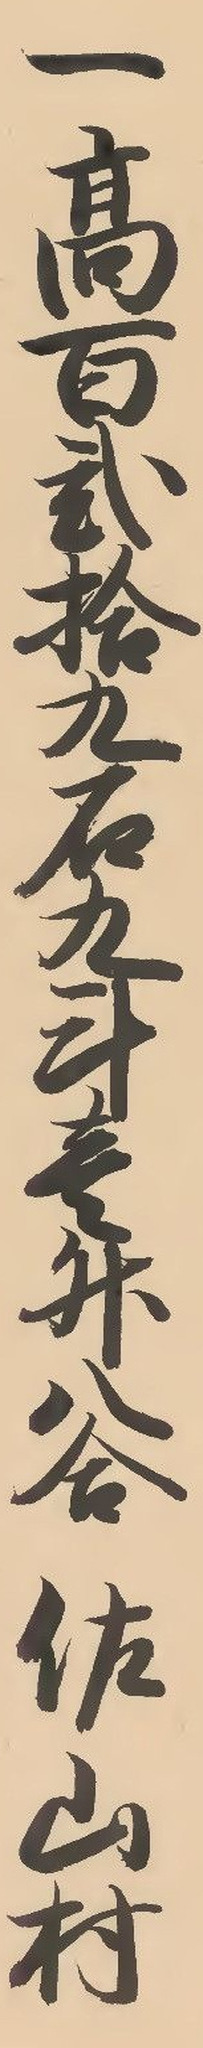一高百弐拾九石九斗壱升八合佐山村
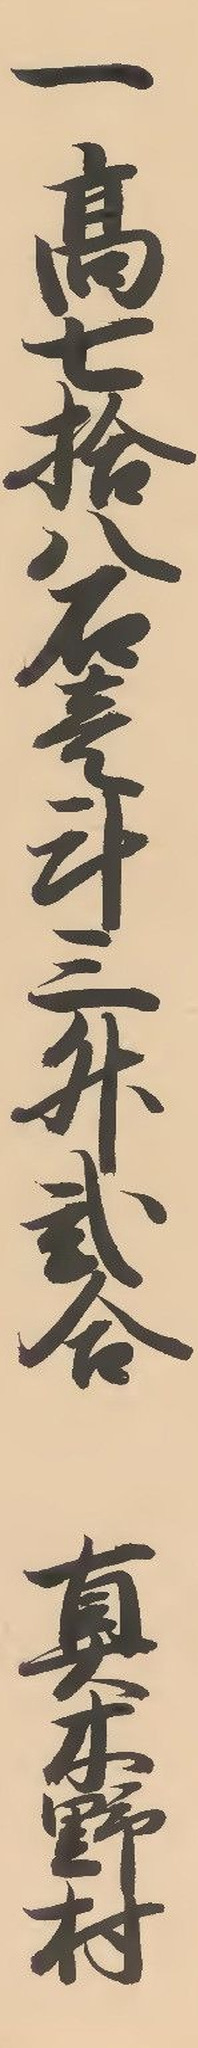一高七拾八石壱斗三升弐合真木野村

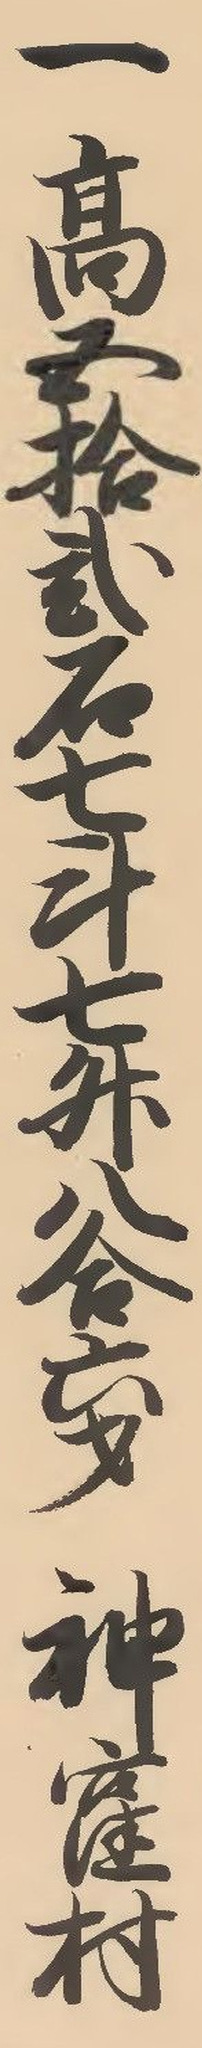一高五拾弐石七斗七升八合六才神窪村
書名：下総国郷帳
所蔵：国立公文書館 National Archives of Japan
